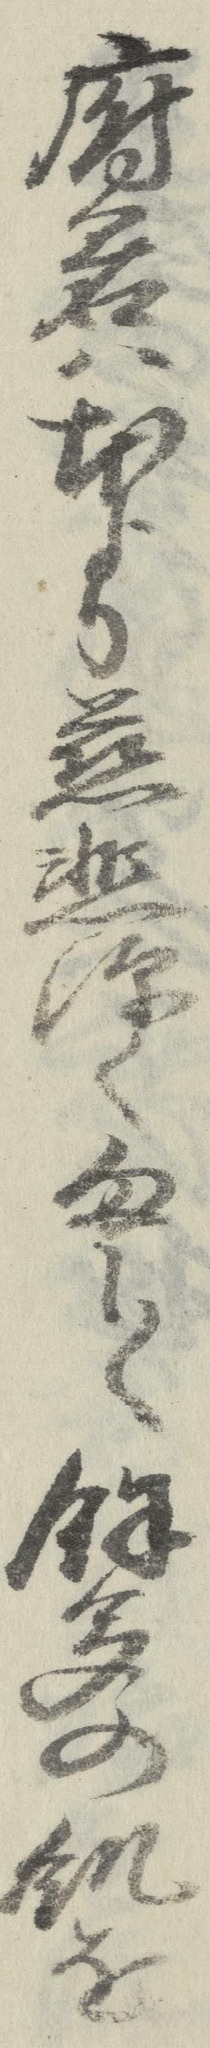府君は本より慈悲深くまし〳〵餘多の飢を
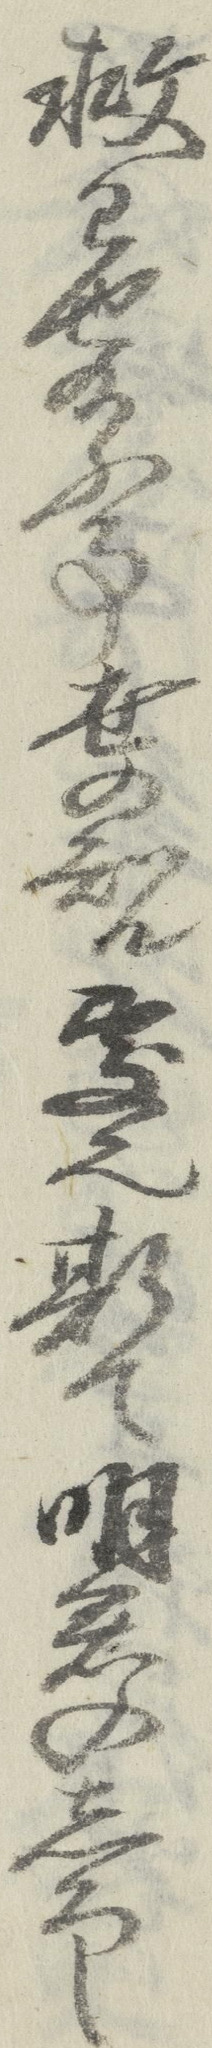救わせ給ふ事世の知処也斯て明君のしろし
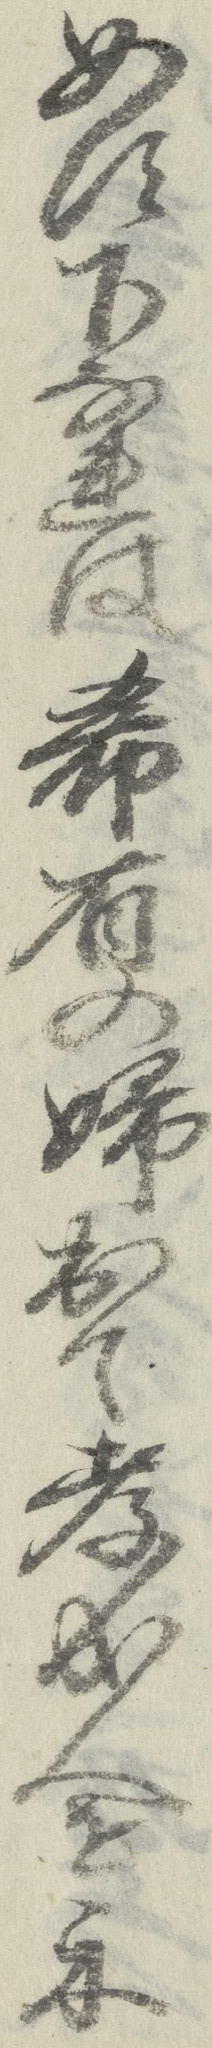めす下なれは希有の婦出て孝成へを示
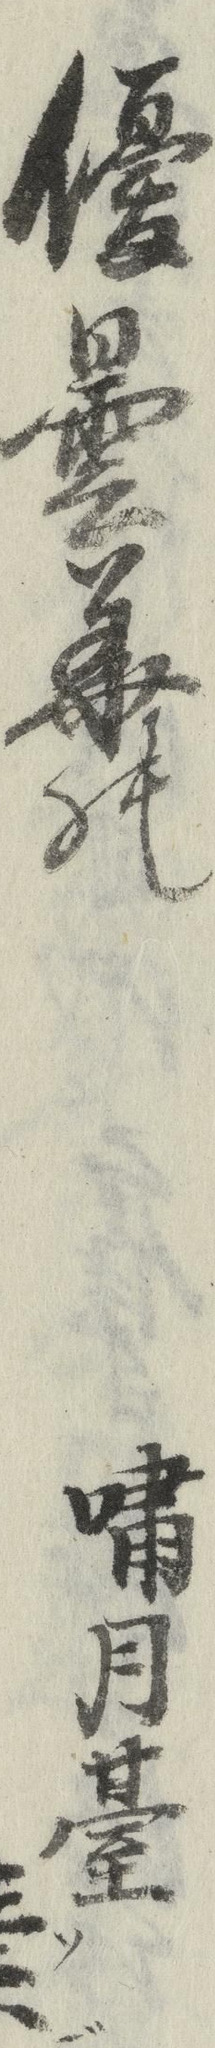優曇華の嘯月臺
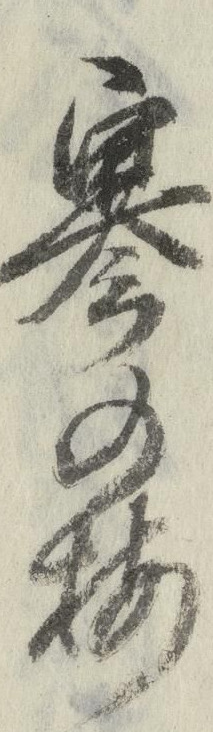寒の梅
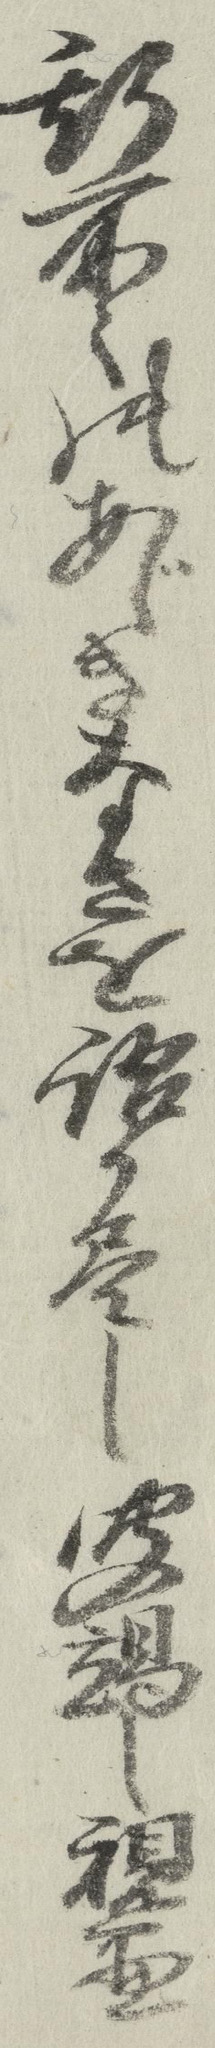斯所々のあじきなさを語り尽し聞竭し視盡
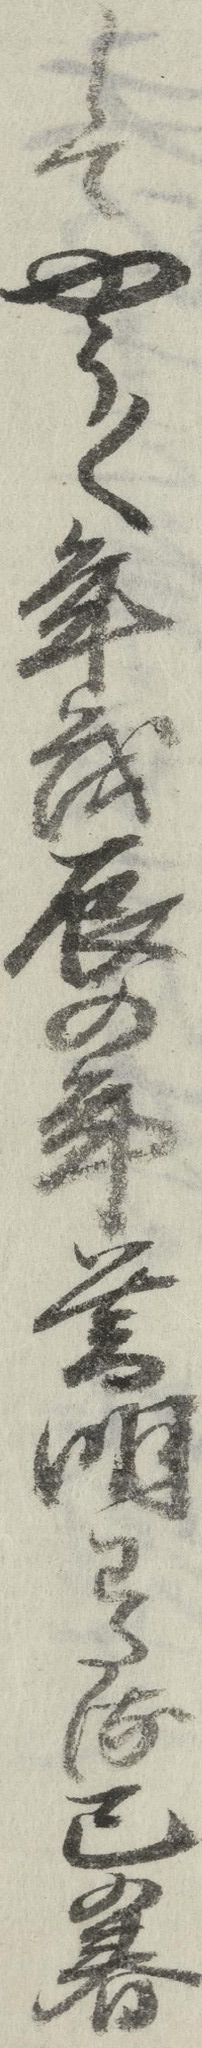してやう〳〵年も辰の年暮明わたる巳の春
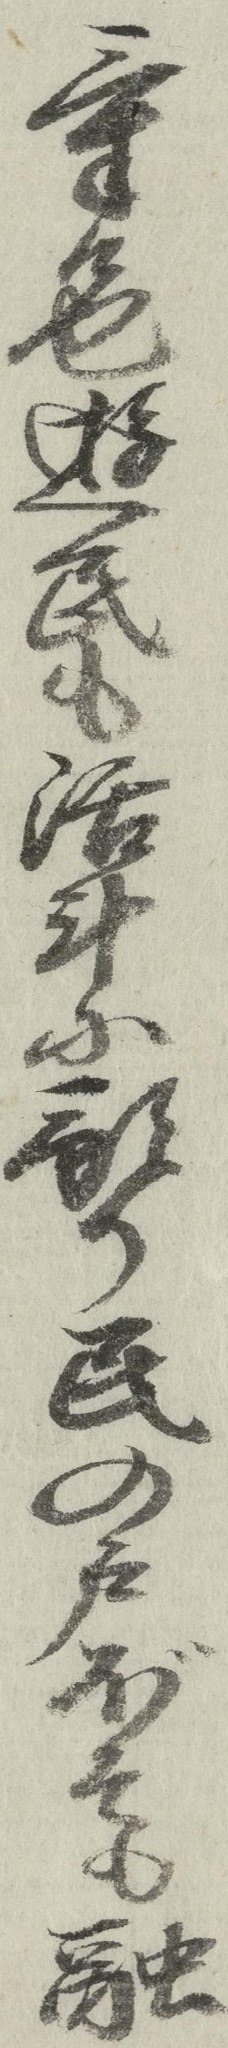気色也遊民も活計に預り民の戸ぼても融
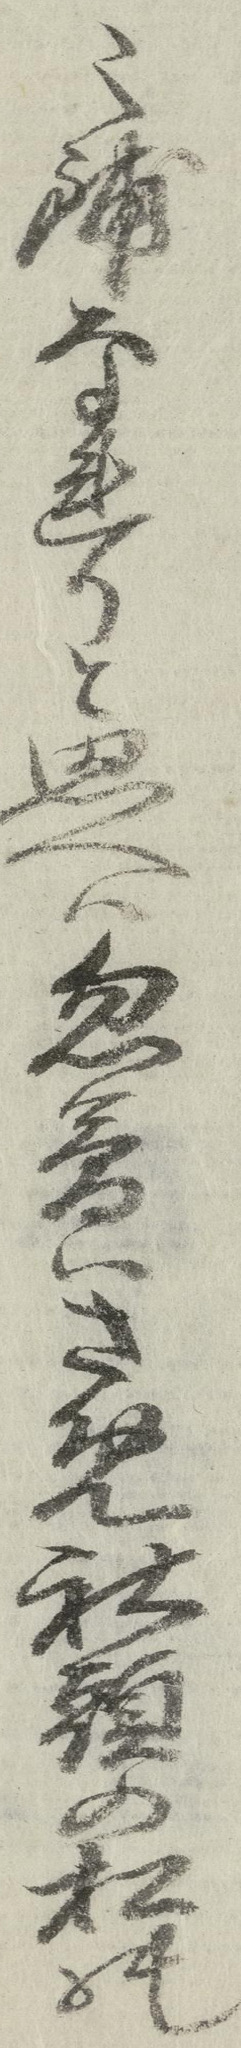々鋪なれりと思へは忽夢はさめ社頭の松の
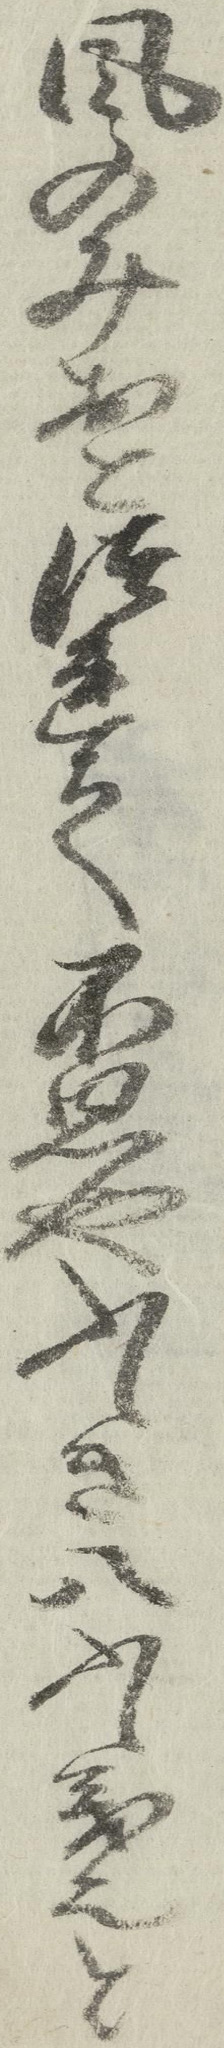風のみおとつれて不思やふしき八ふし義也と
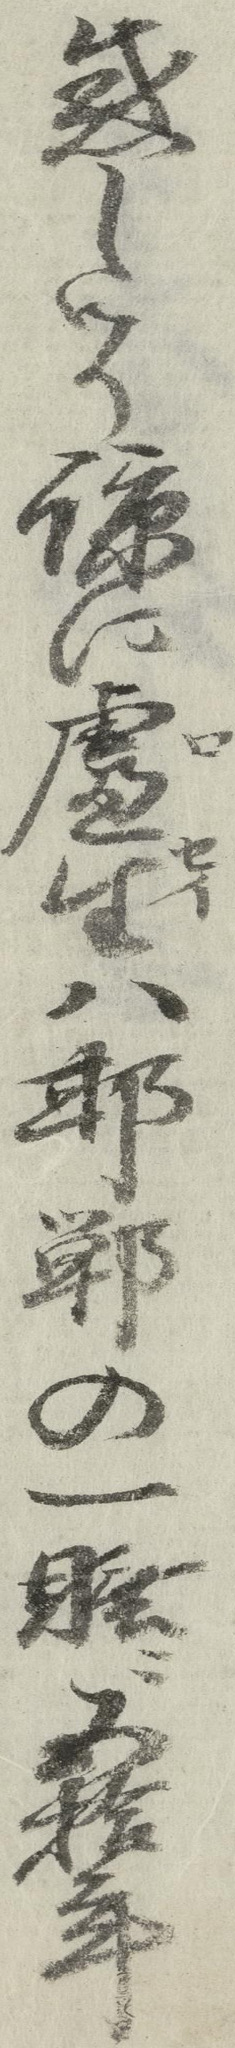感しけり諒に盧生は耶鄲の一睡に五拾年
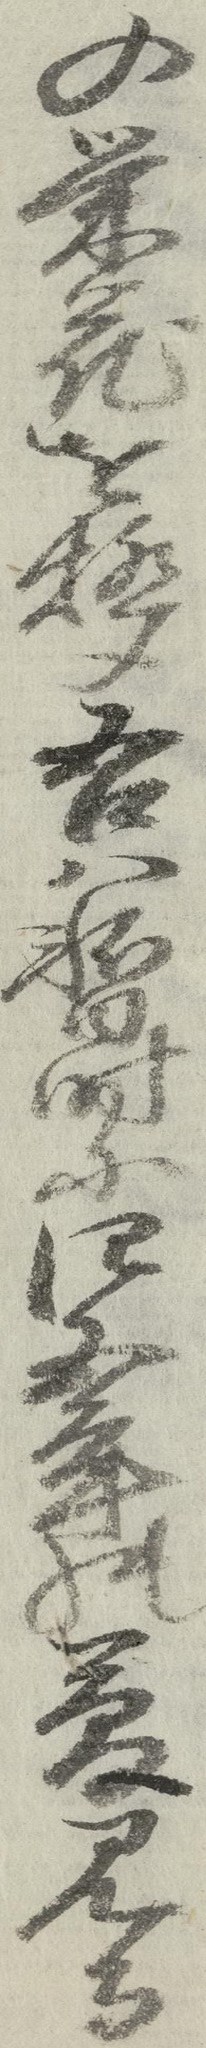の栄花を極メ吾は暫時に四五年の夢見る
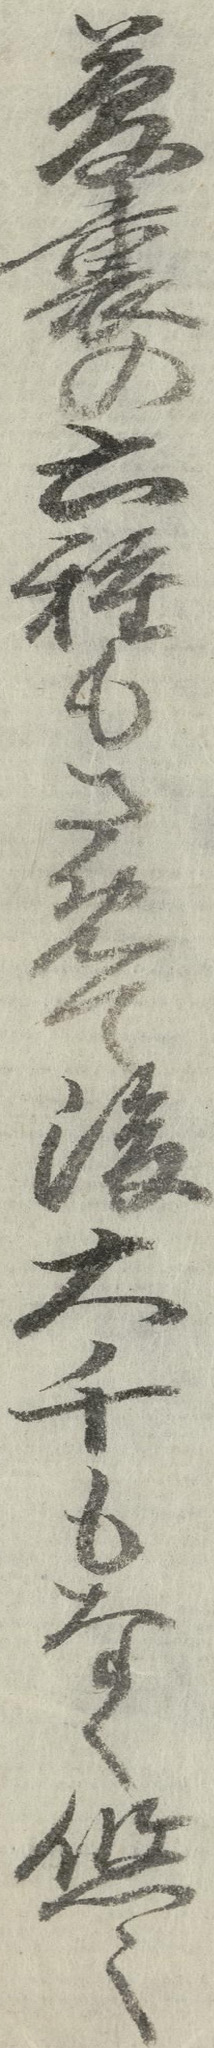夢裏の六程もさめて後大千もなく悠〻

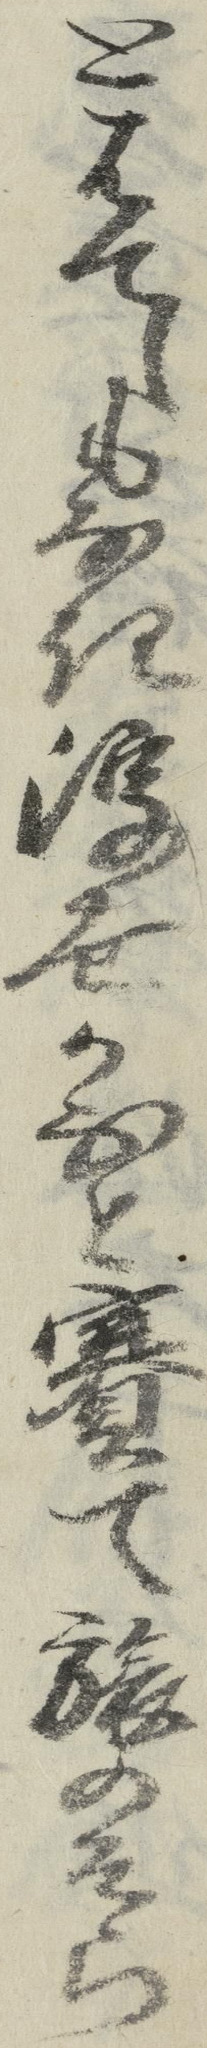とはてしもなき浮世かなと賽て旅のそら
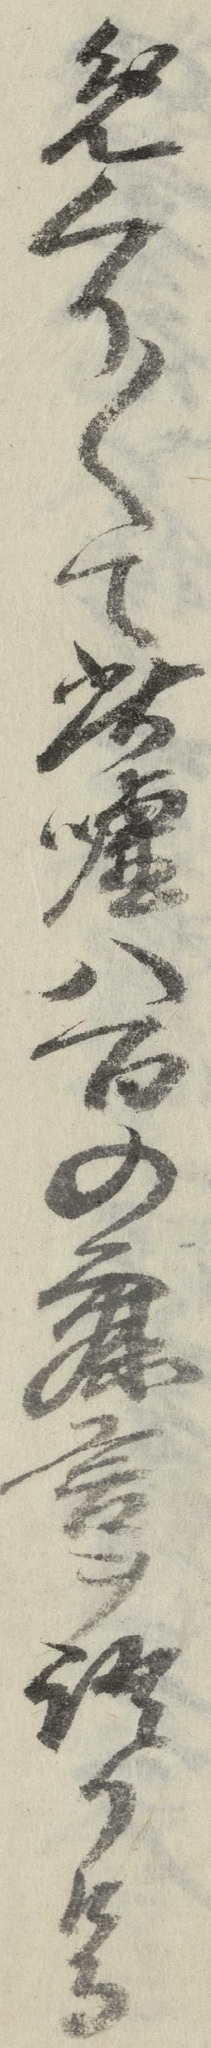めくり〳〵て此嘘八百の寝言ヲ語りける
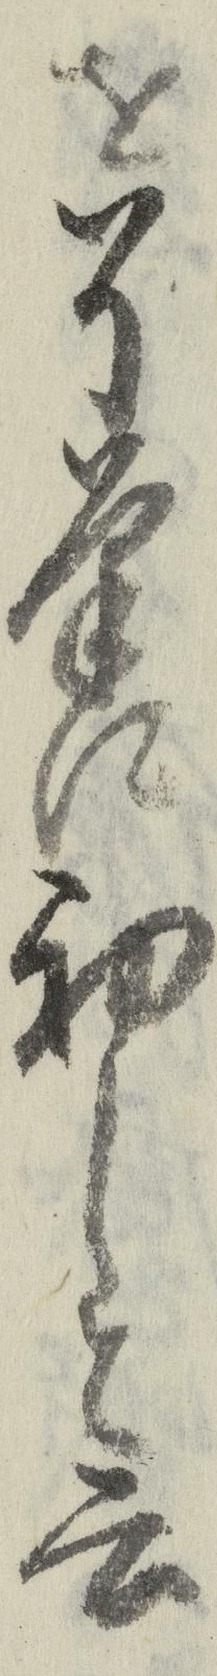を了筆に初しと云
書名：浅間大焼騒動記　下
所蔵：東京大学地震研究所図書室 Earthquake Research Institute Library, The University of Tokyo, JAPAN
